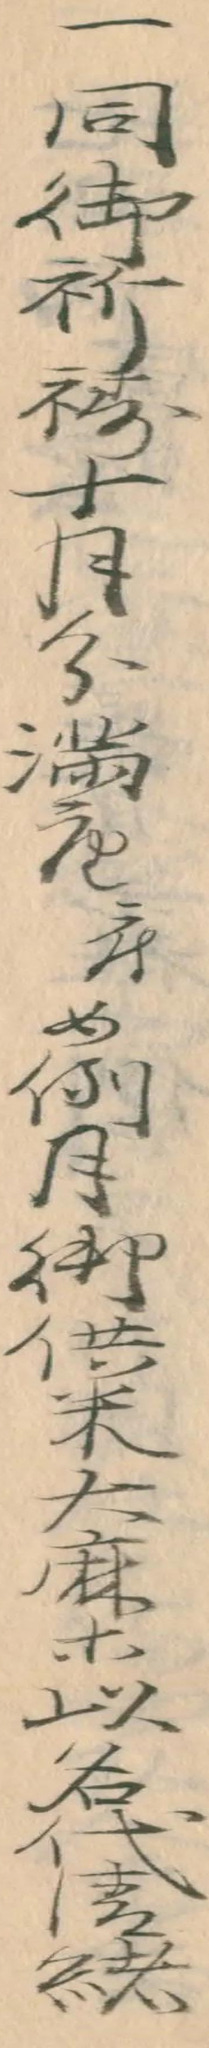一同御祈祷十月分満座ニ付如例月御供米大麻等以名代清緒
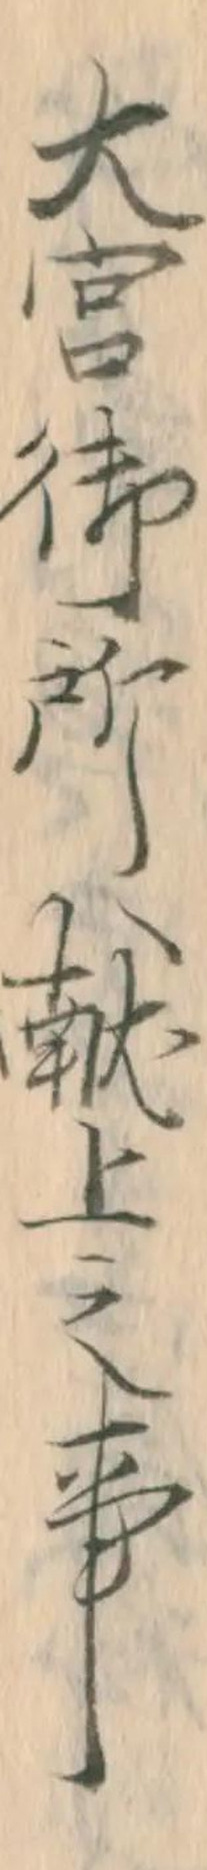大宮御所へ献上之事
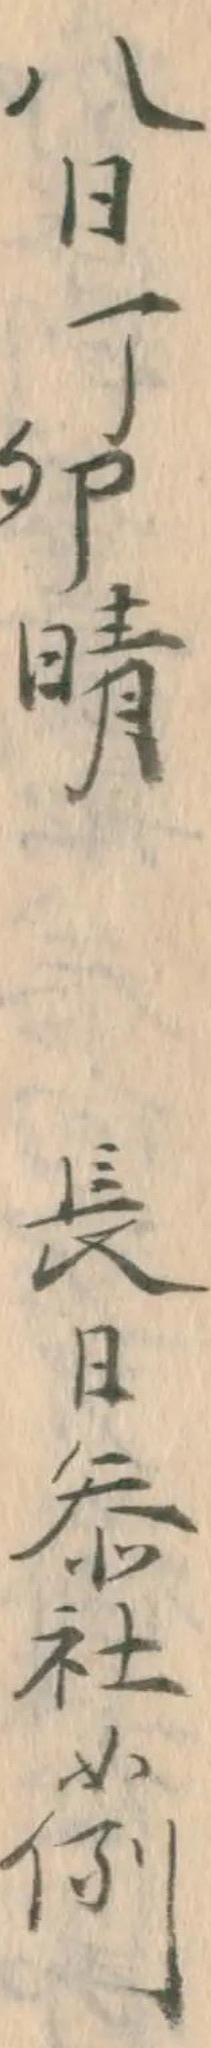八日丁卯晴長日参社如例
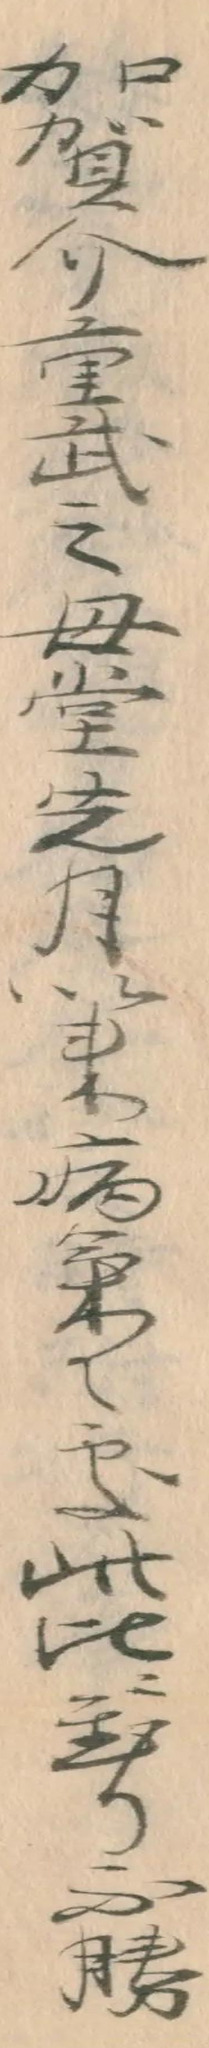一加賀介重武之母堂先月以来病氣之處此比ニ至り不勝
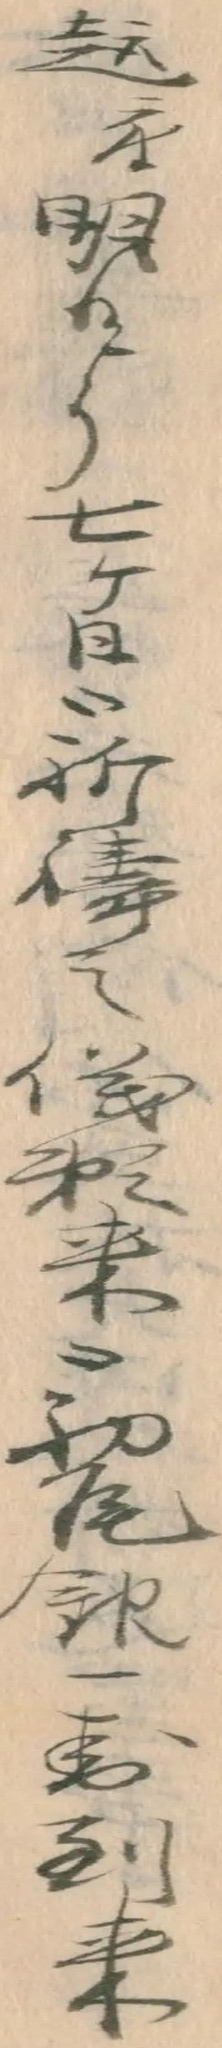趣ニ付明日より七ケ日御祈祷之儀頼来御初尾銀一歩列来
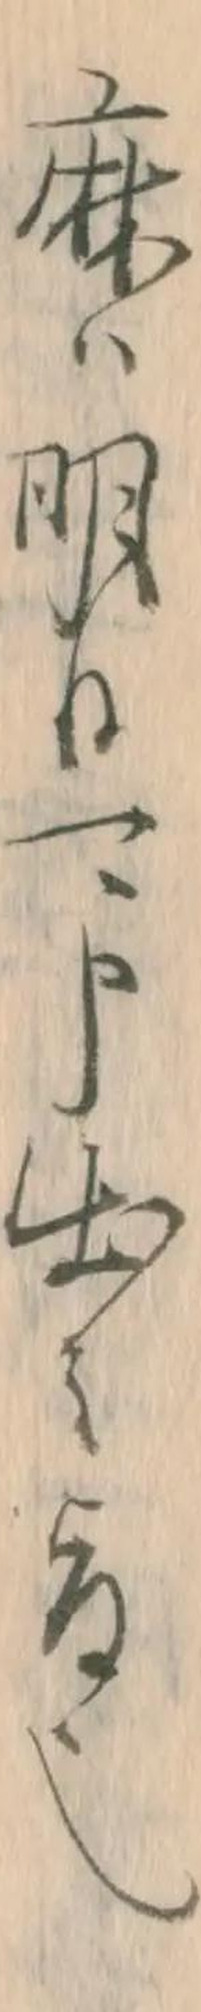麻ハ明日可申出之旨也
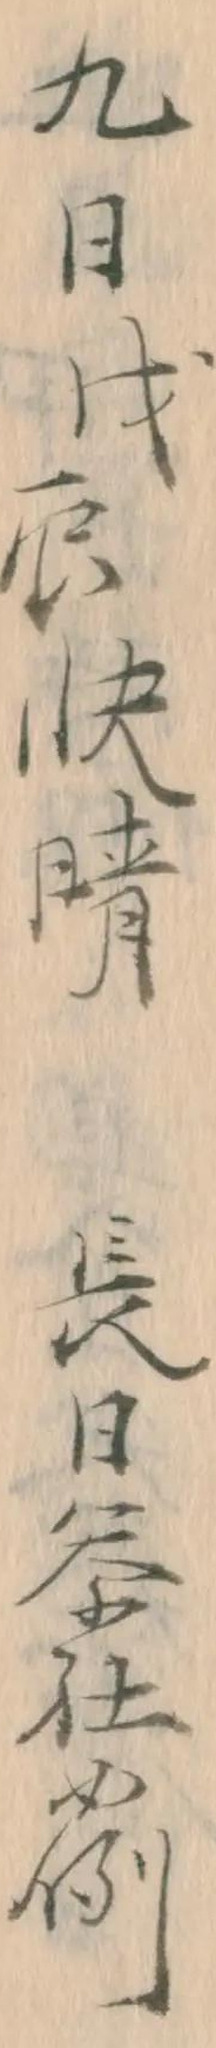九日戊辰快晴長日参社如例
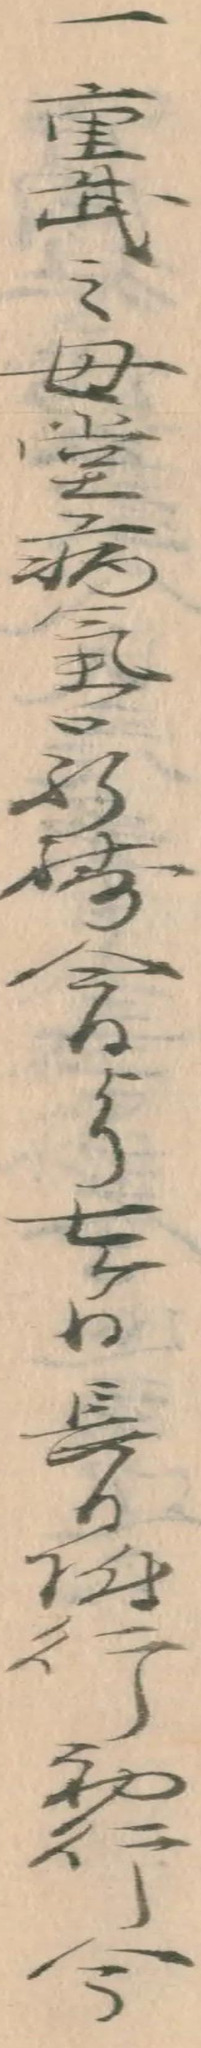一重武之母堂病氣御祈祷今日より七ケ日長日附行勤行今
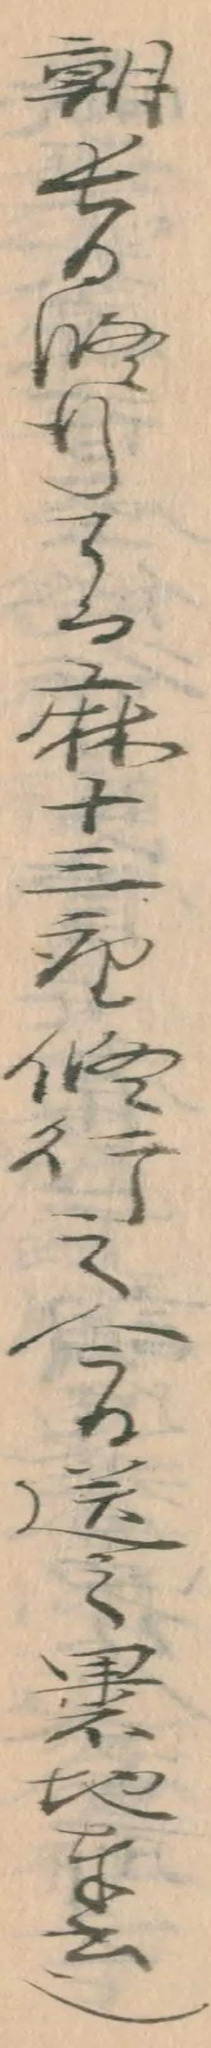朝長日修行了而麻十三座修行也今日送之褁地奉書也
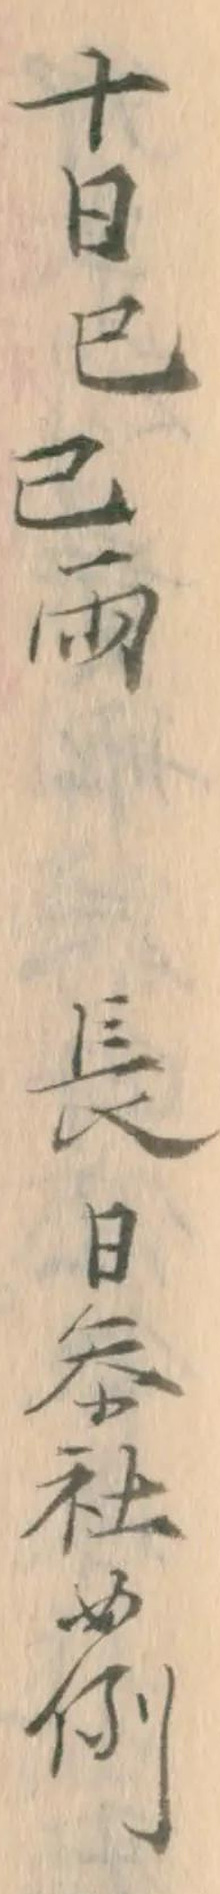十日己巳雨長日参社如例
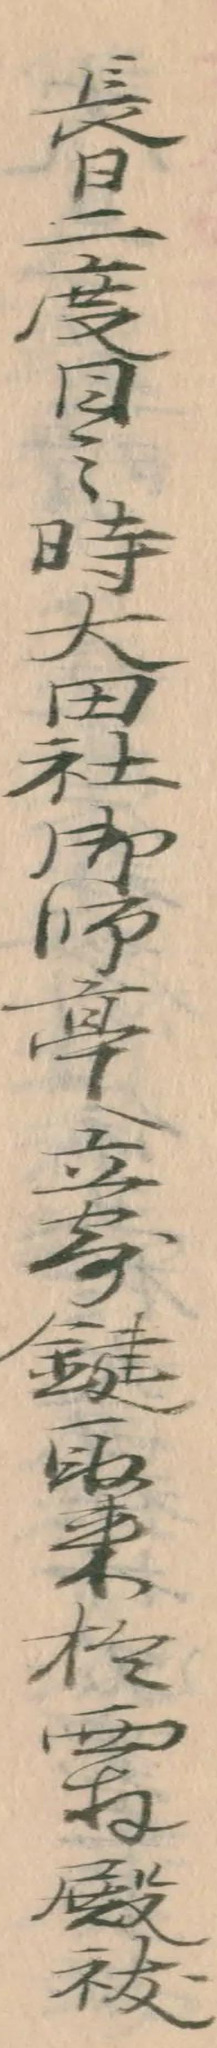一長日二度目之時大田社御師亭へ立寄鍵取来於西拝殿祓
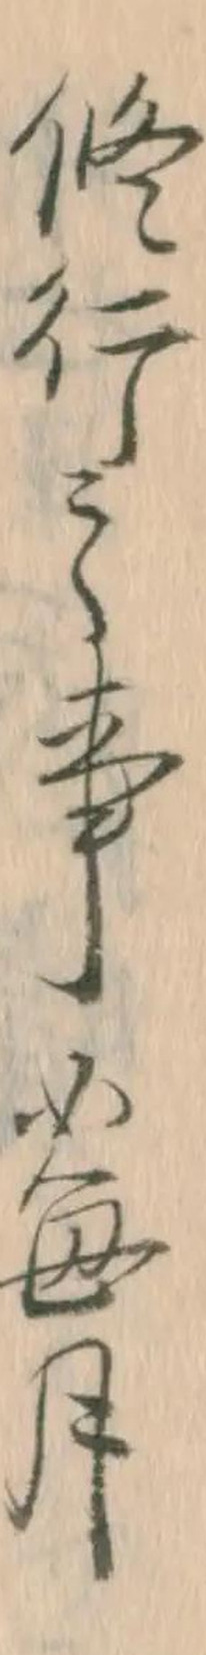修行之事如毎月
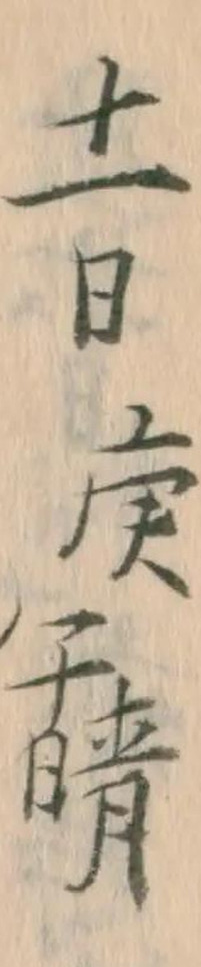十一日庚申晴
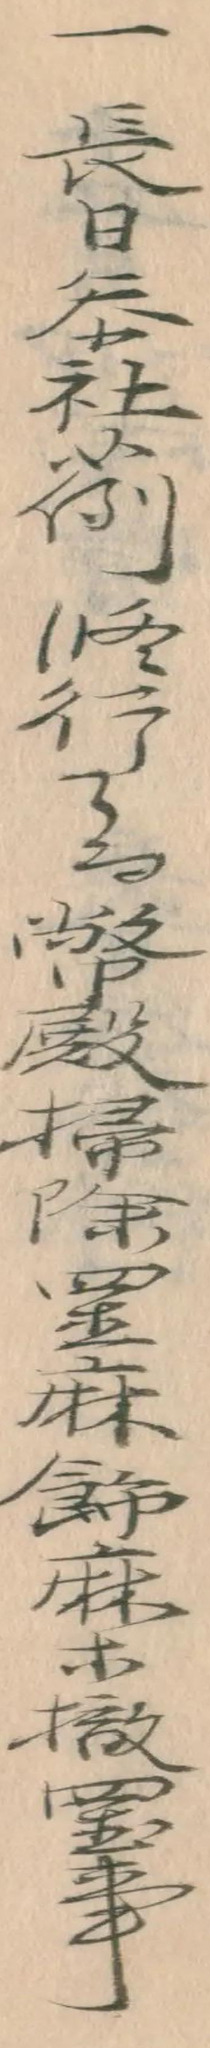一長日参社如例修行了而幣殿掃除置麻飾麻等撒置事
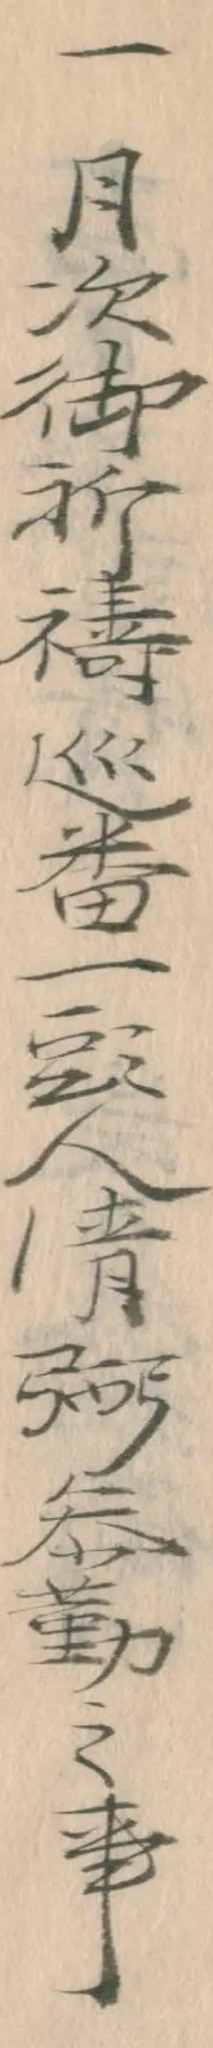一月次御祈祷巡番一郡人清弼参勤之事
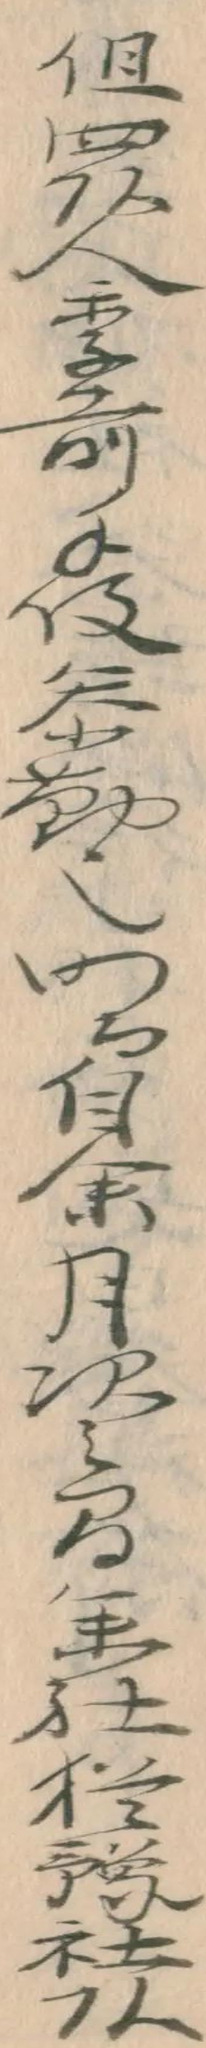但四頭人季前手役参勤也仍而自余月次之間参社猶豫社頭
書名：賀茂社記録. 第74冊
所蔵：国立国会図書館 National Diet Library, JAPAN
